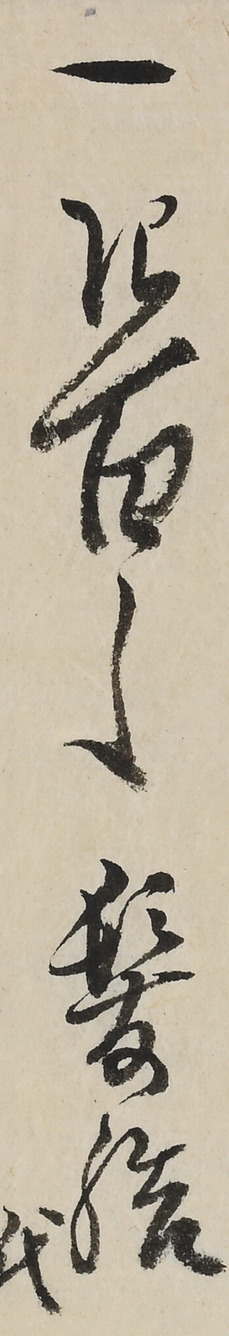一四百文髪結代
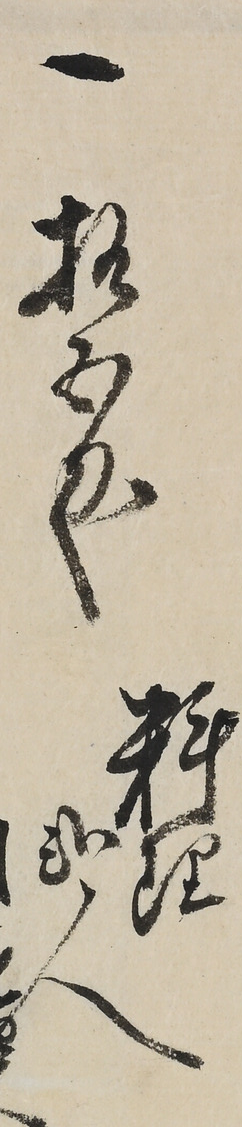一拾五匁料理
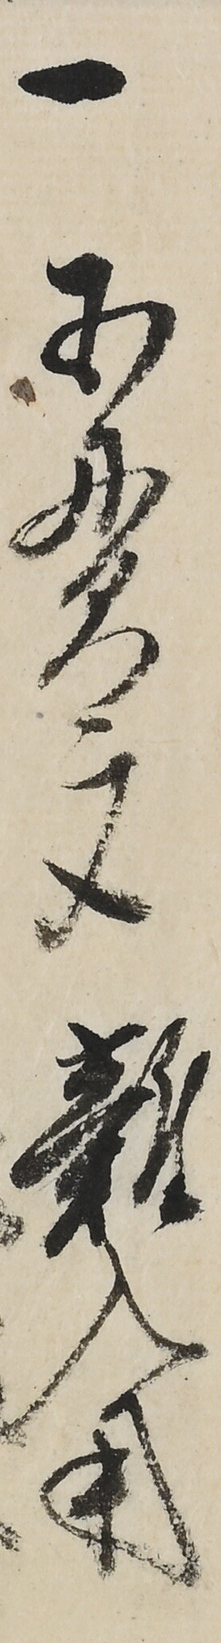一五貫文雑入用
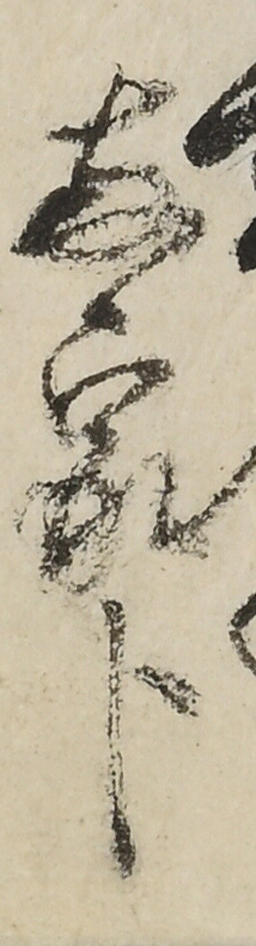両家分

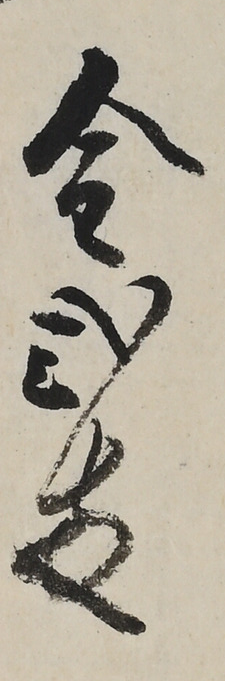金弐両
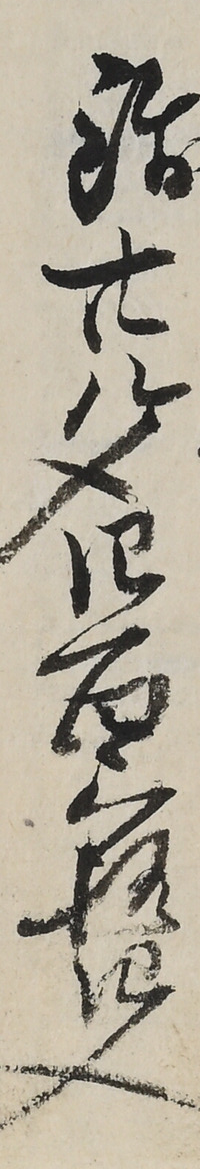〆銭廿八貫四百三拾四文
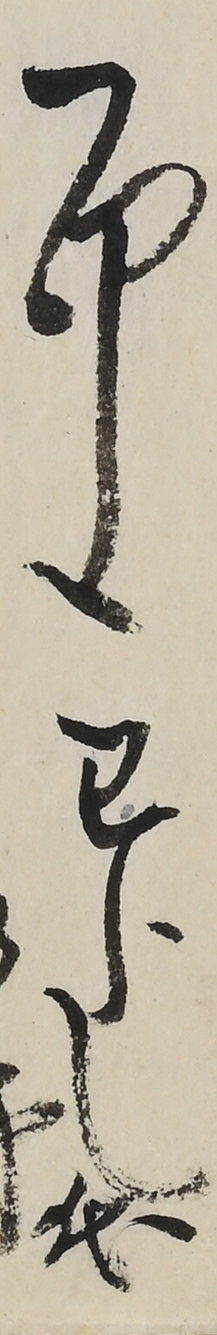百文わらし代
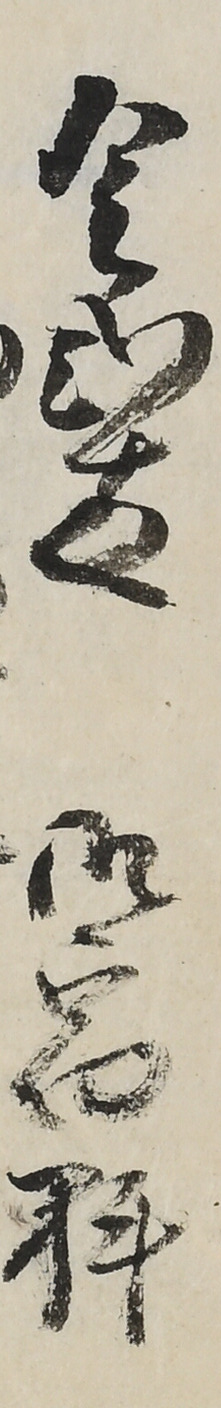金弐両御宿料
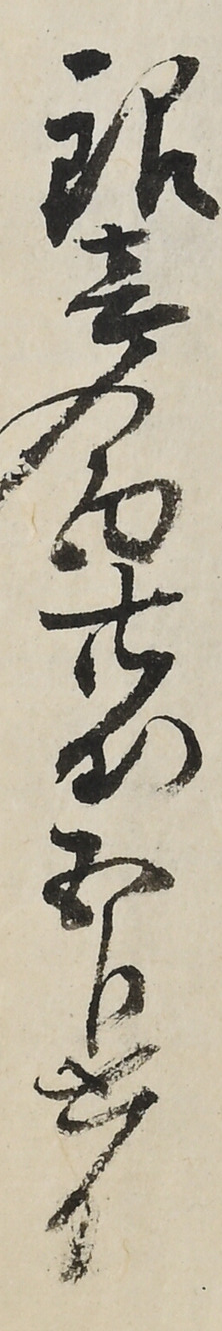銀壱貫百廿匁五分六厘
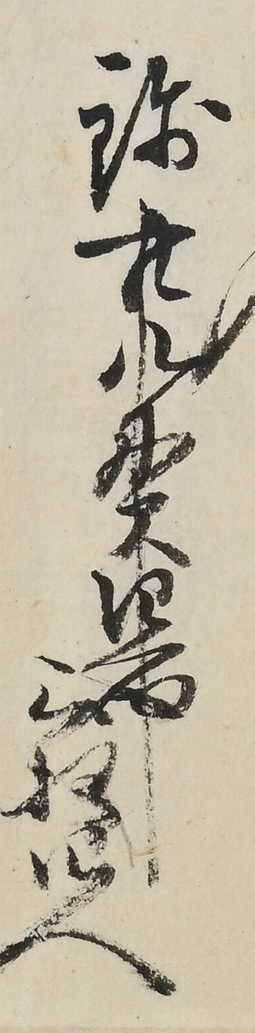〆銭廿八貫四百三拾四文
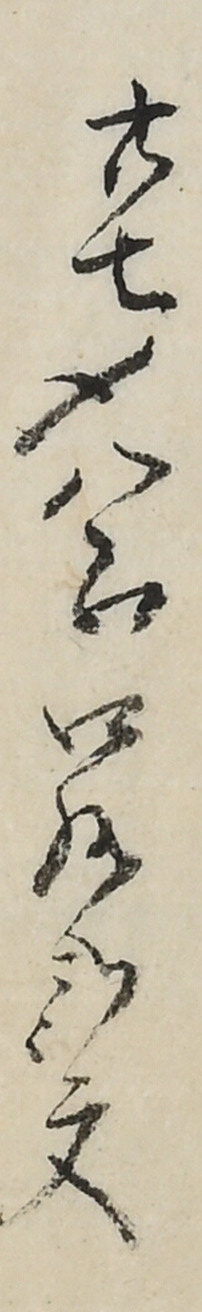廿七貫八百四拾弐文
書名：御巡察様御泊御入用書上帳
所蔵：伊那市立高遠町図書館・合同会社AMANE
